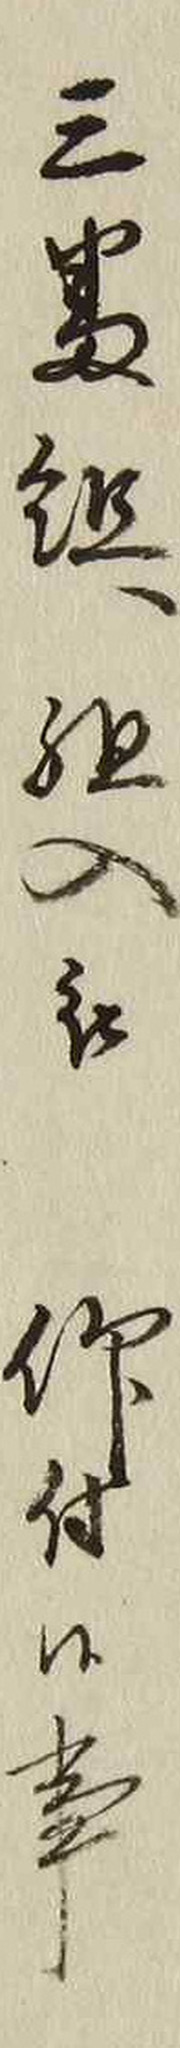三番組へ組入被仰付候事
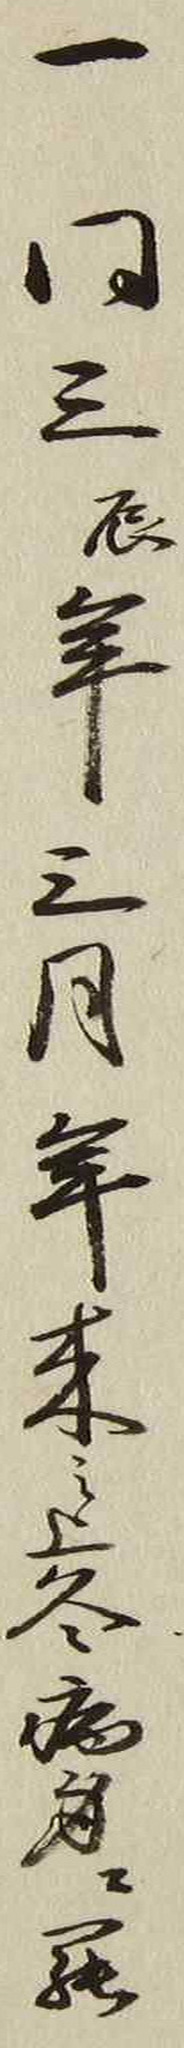一同三辰年三月年来之上冬病身ニ罷
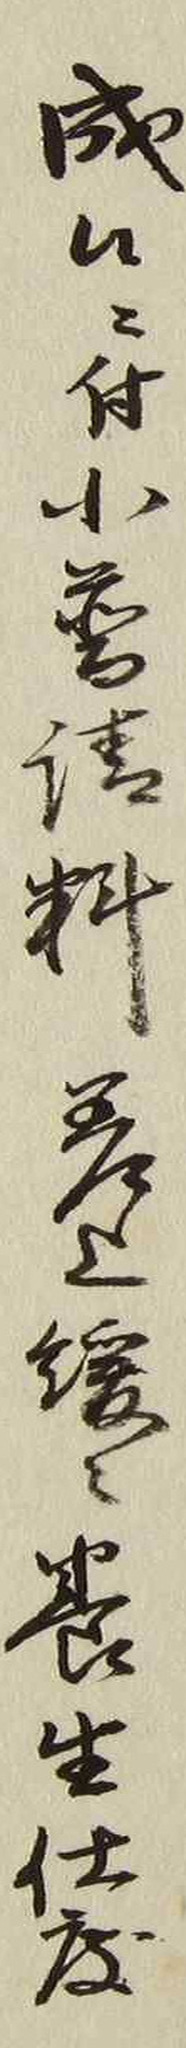成候ニ付小普請料差上緩々養生仕度
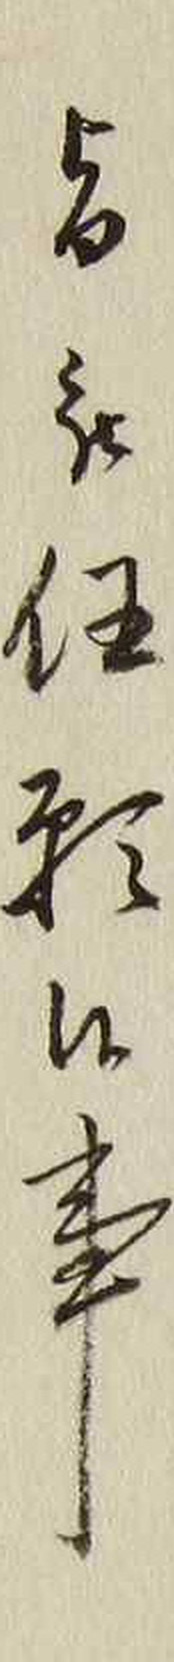旨被任願候事
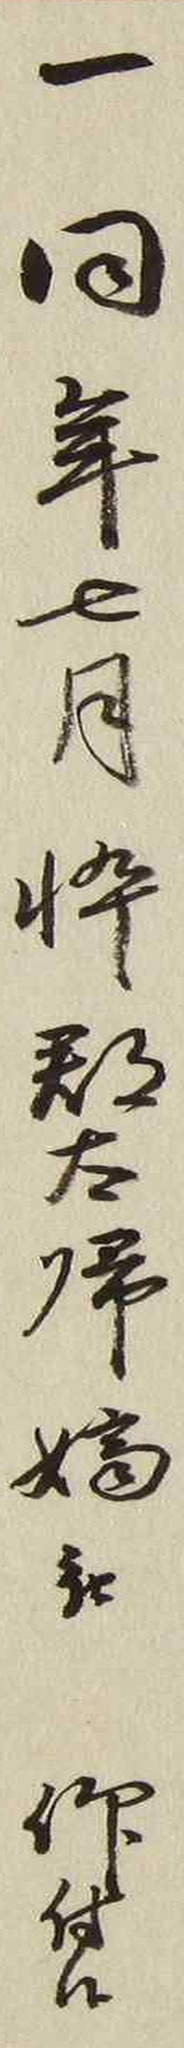一同年七月忰郡太帰嫡被仰付候

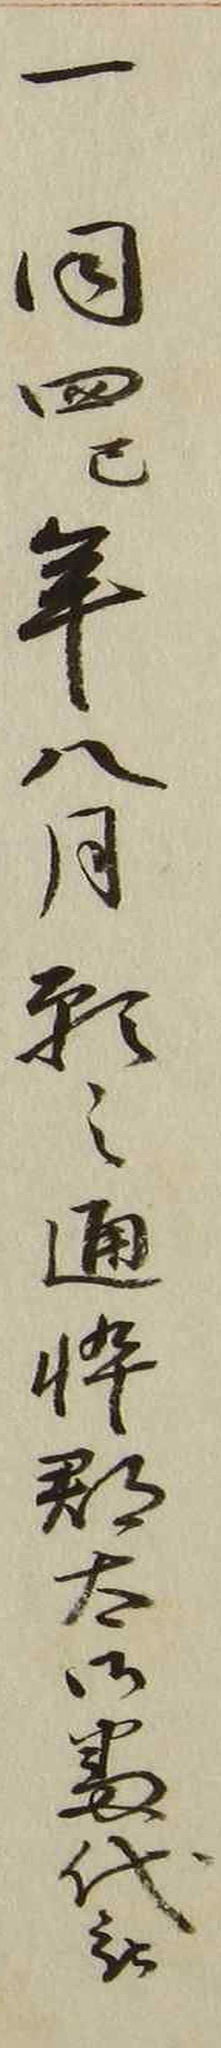一同四巳年八月願之通忰郡太御番代被
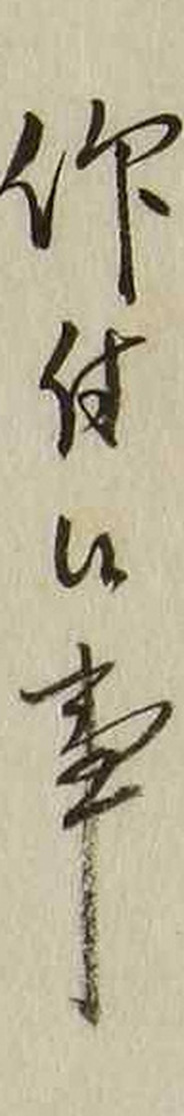仰付候事
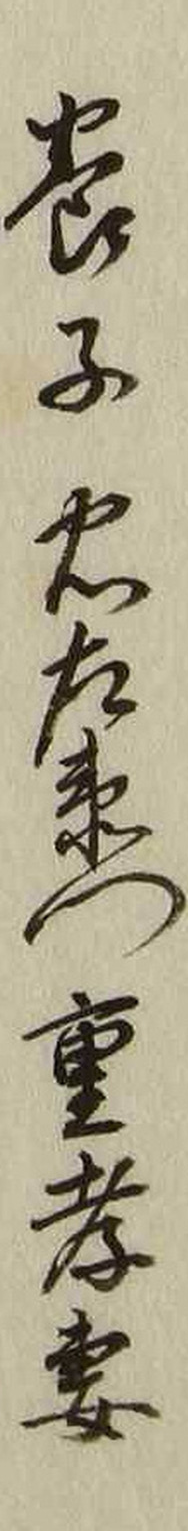女養子忠左衛門重孝妻
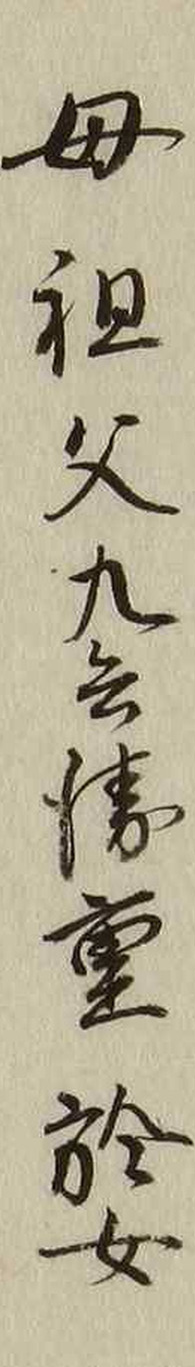母祖父九兵衛重於女
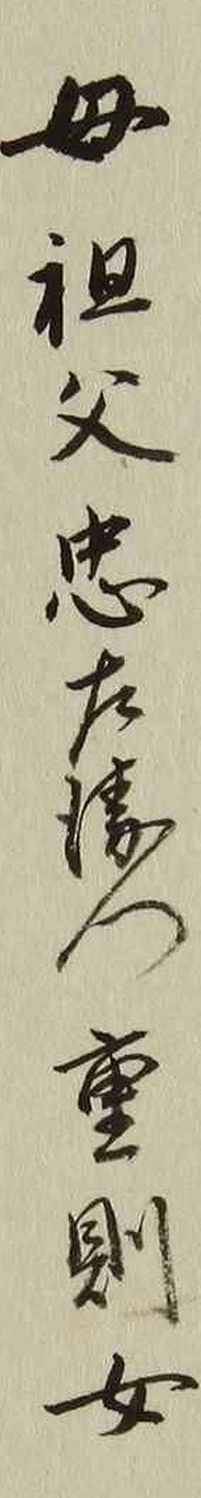母祖父忠左衛門重則女
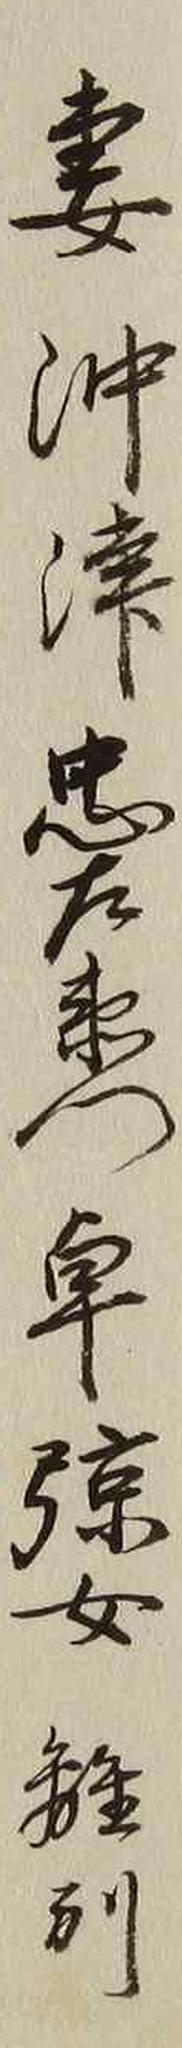妻沖津忠左衛門卓弶女離別
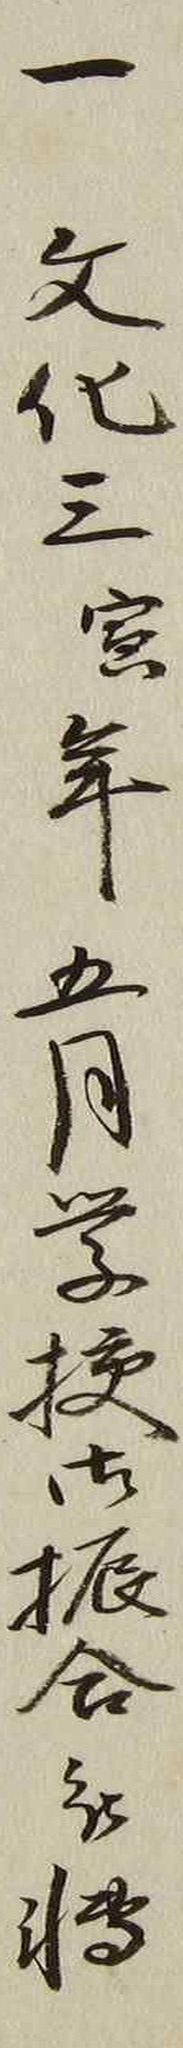一文化三寅年五月学校御振合被転
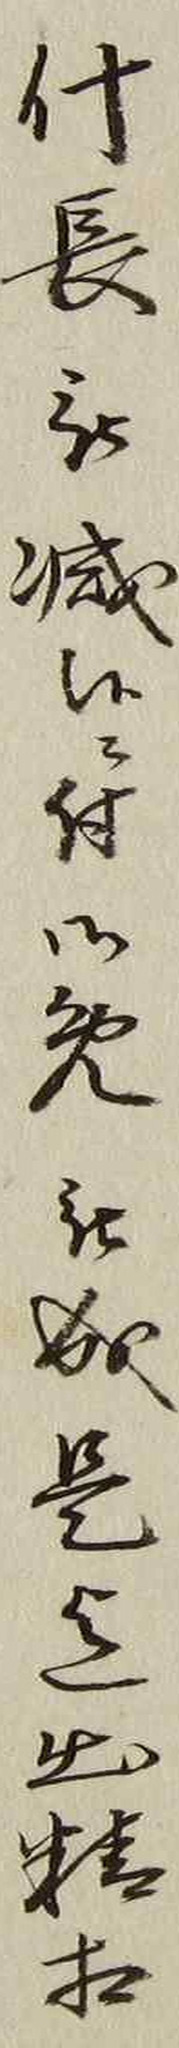什長被減候ニ付御免被成是迄出精相
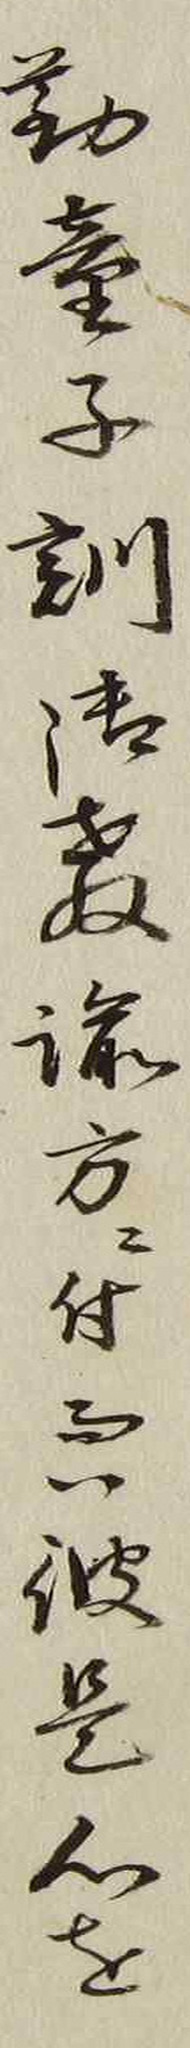勤童子訓御教諭方ニ付而ハ彼是心を
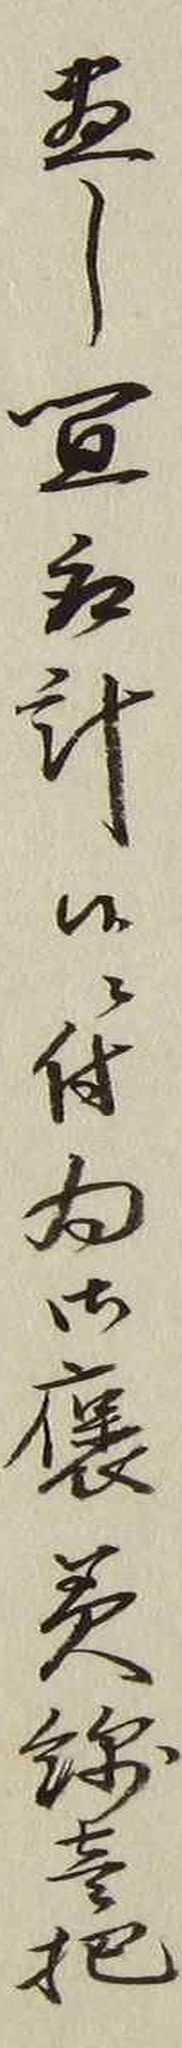尽し宜取計候ニ付為御褒美綿壱把
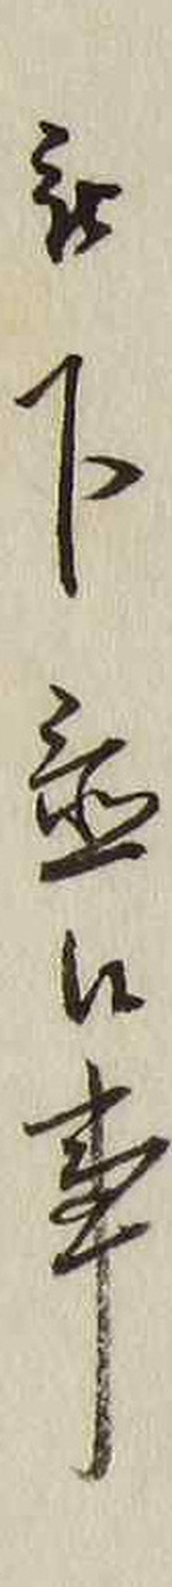被下置候事
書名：諸士系譜　巻之149　そ之部2
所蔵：会津若松市立会津図書館
